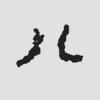八
